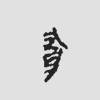詹
